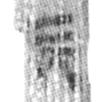天
